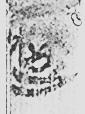楚
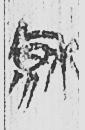穆
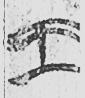王
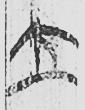立
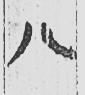八
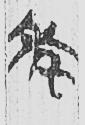年
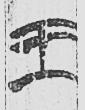王
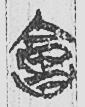會
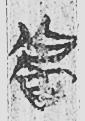者
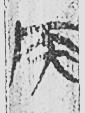侯
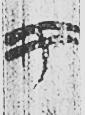于
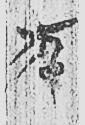犮
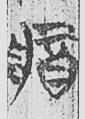𨟻
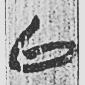㠯（以）
